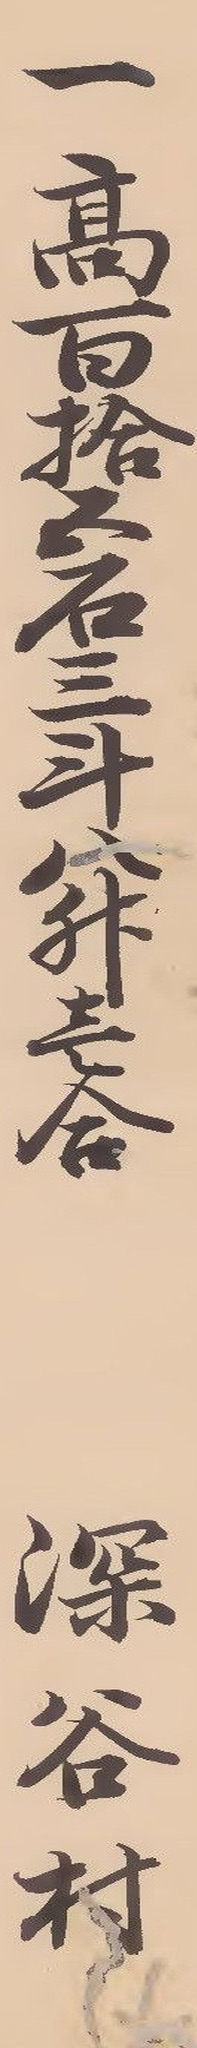一高百拾五石三斗八升壱合深谷村
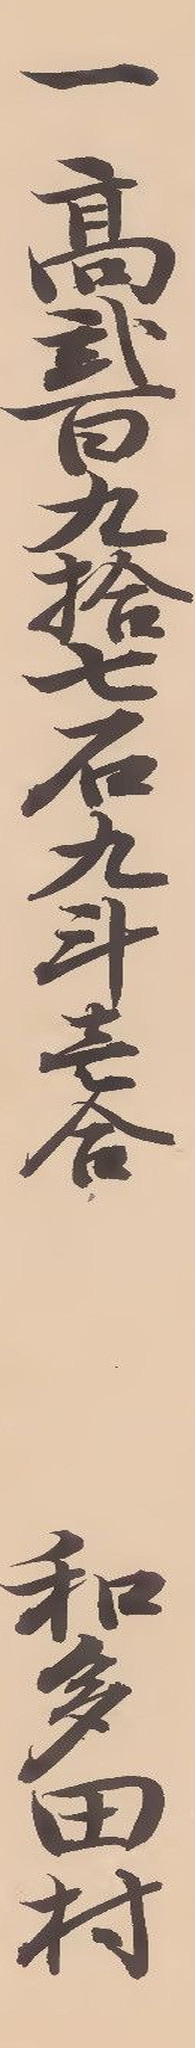一高弐百九拾七石九斗壱合和多田村
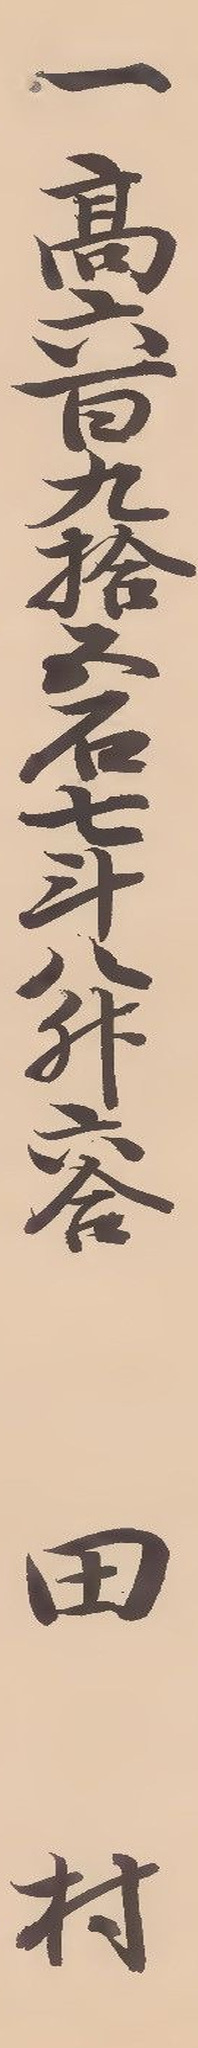一高六百九拾五石七斗八升六合田村
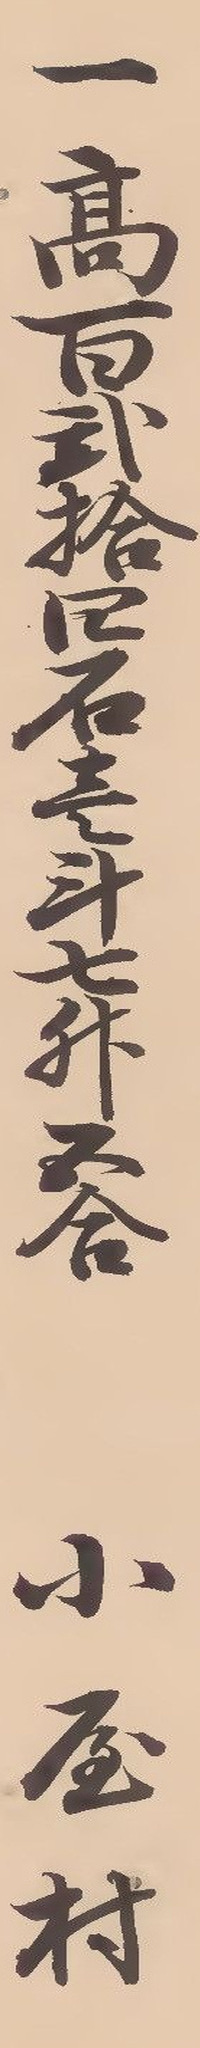一高百弐拾四石壱斗七升五合小屋村
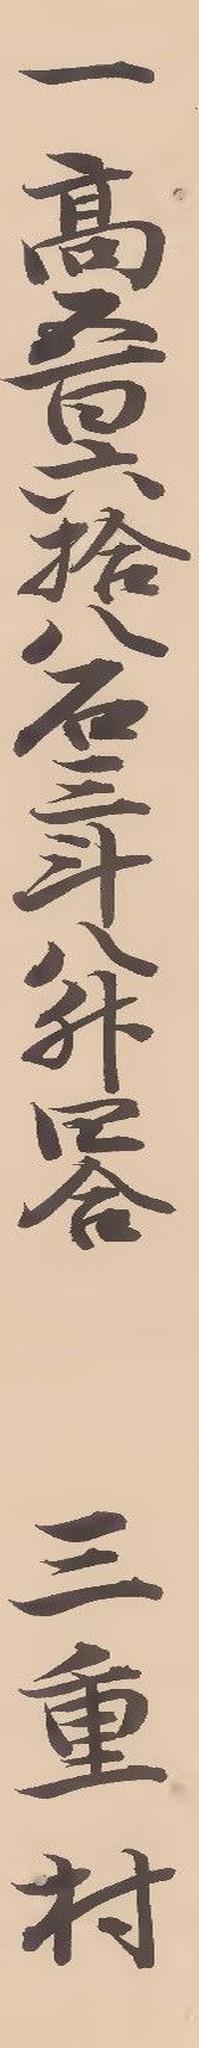一高五百六拾八石三斗八升四合三重村
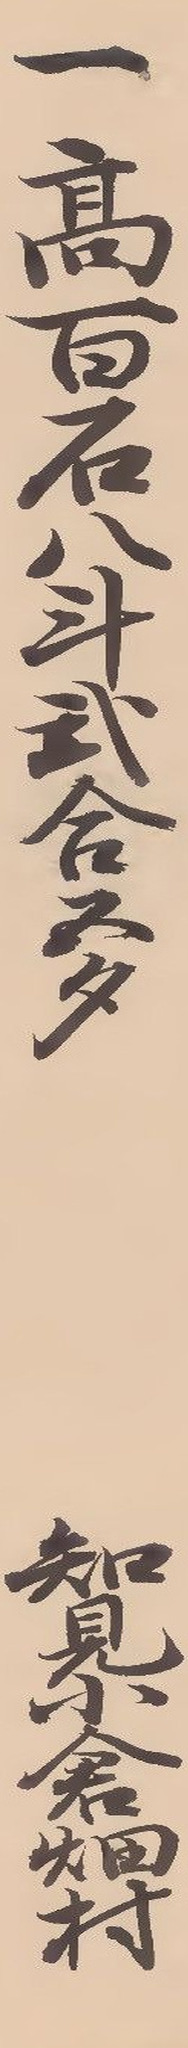一高百石八斗弐合五勺知見小倉畑村
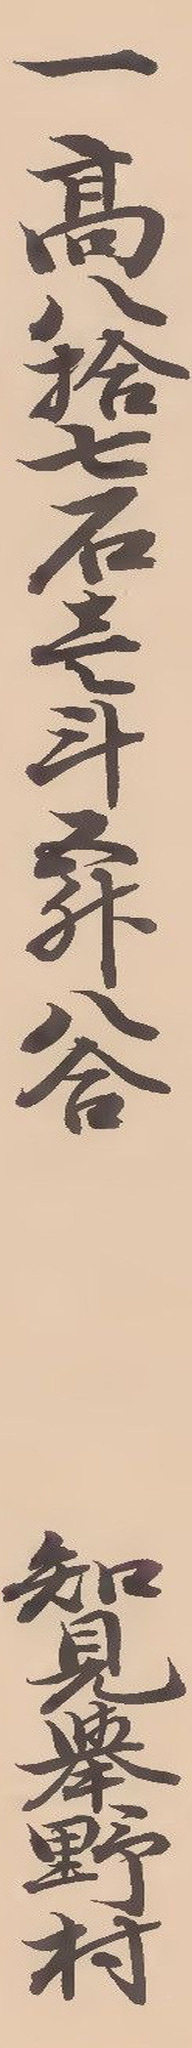一高八拾七石壱斗五升八合知見挙野村
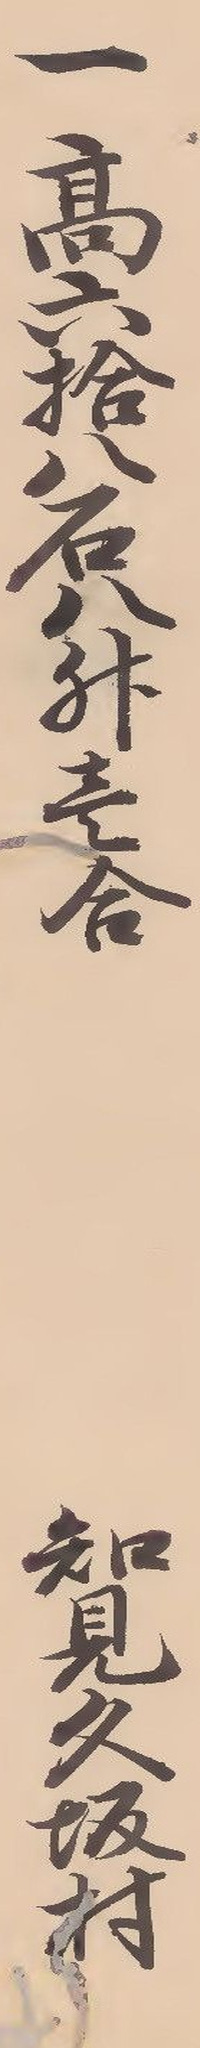一高六拾八石八升壱合知見久坂村

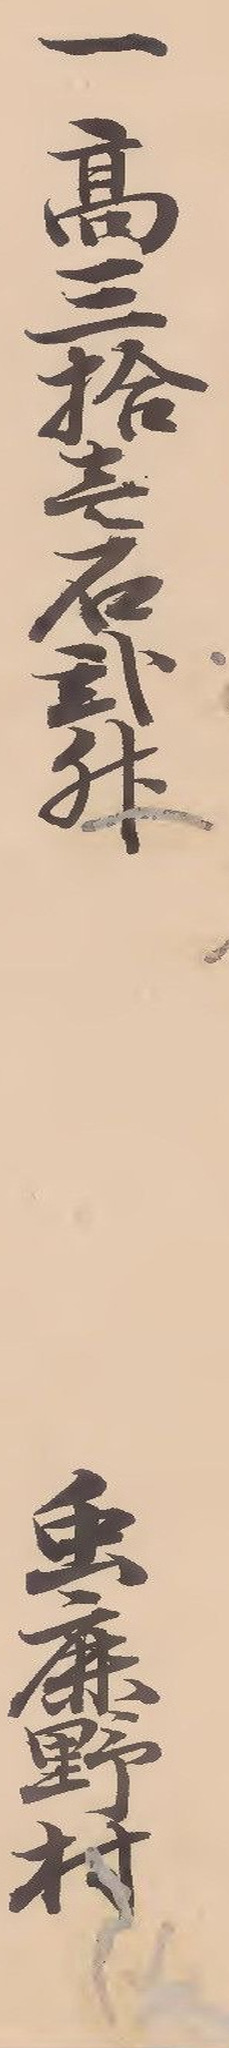一高三拾壱石弐升虫鹿野村
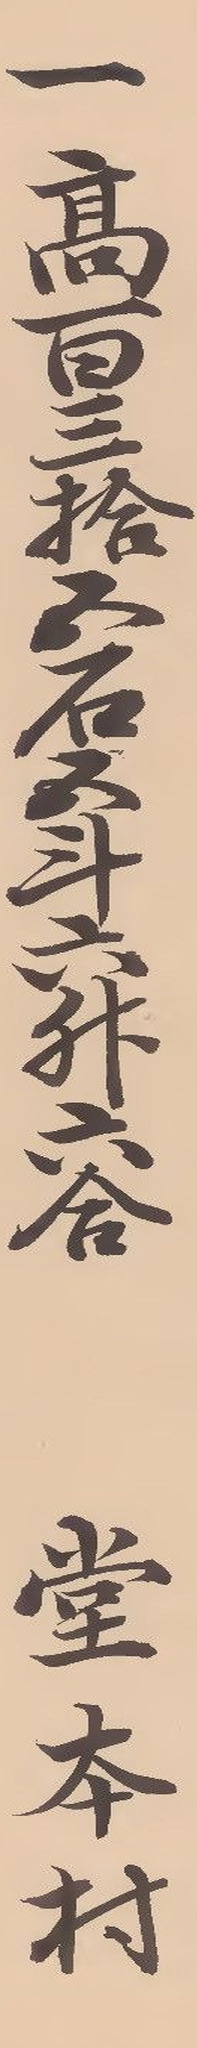一高百三拾五石五斗六升六合堂本村
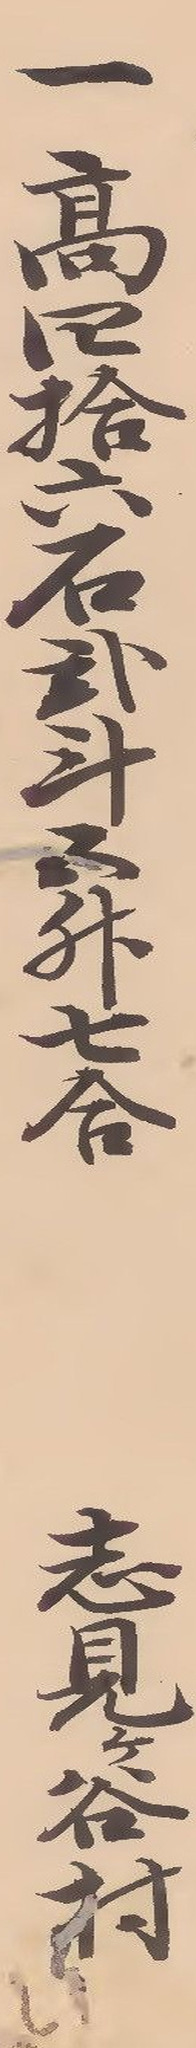一高四拾六石弐斗五升七合志見ヶ谷村

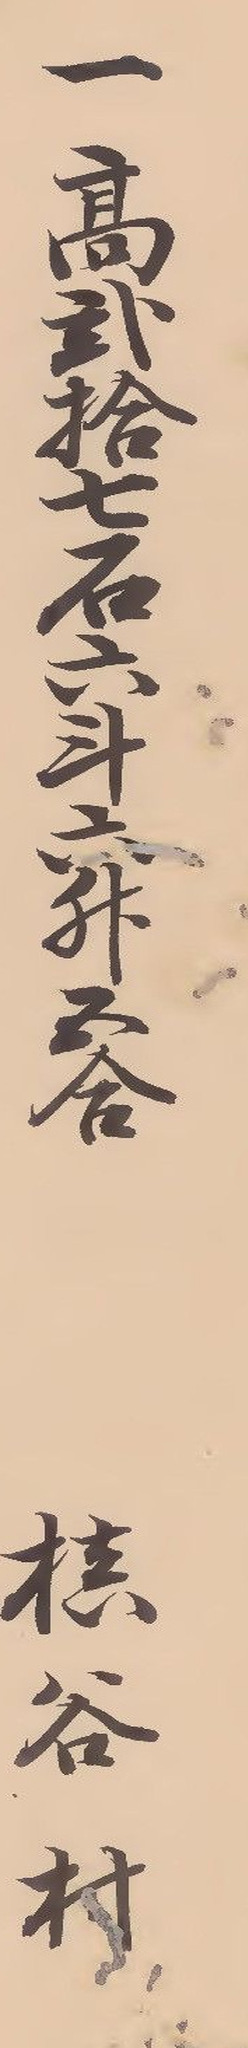一高弐拾七石六斗六升五合槙谷村
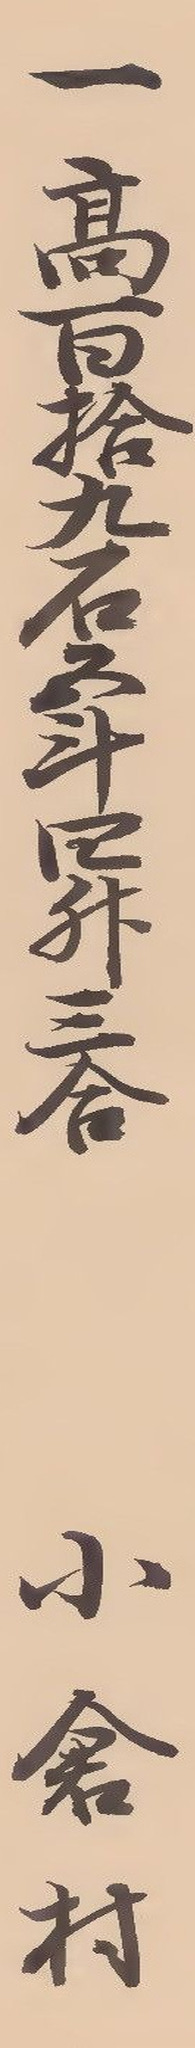一高百拾九石五斗四升三合小倉村
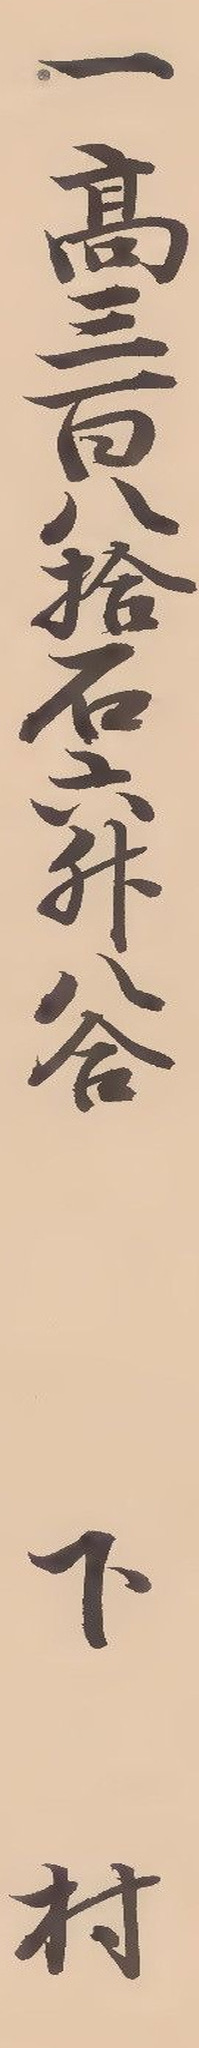一高三百八拾石六升八合下村
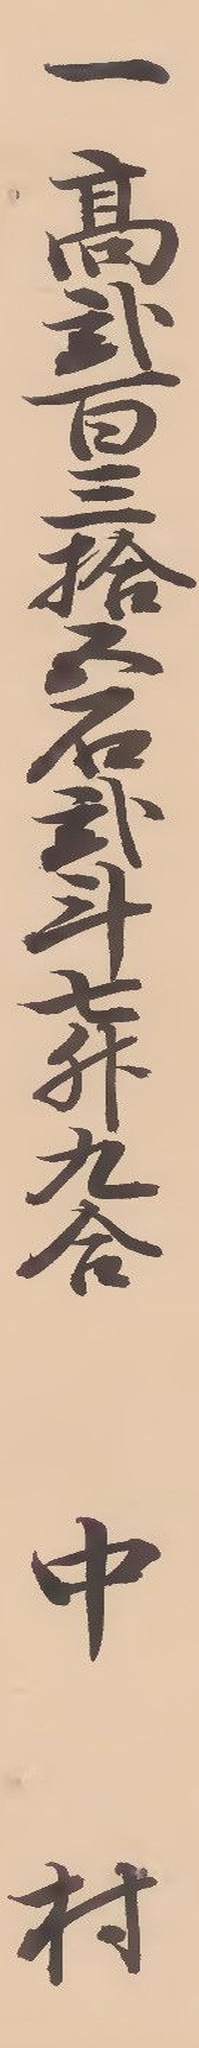一高弐百三拾五石弐斗七升九合中村
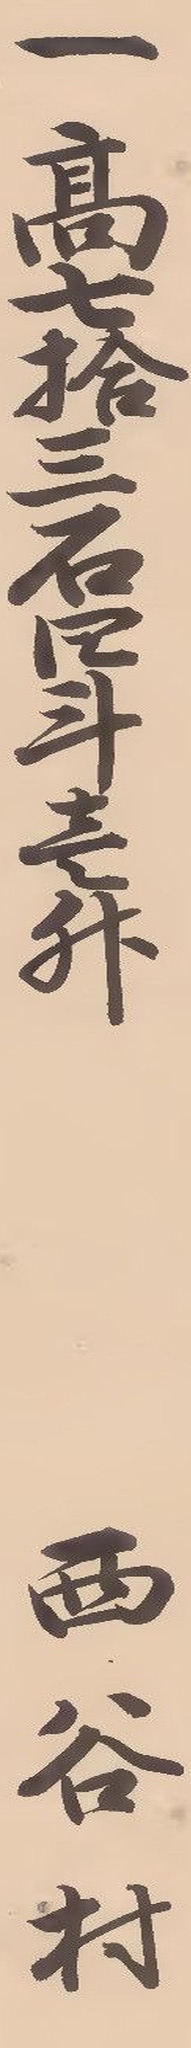一高七拾三石四斗壱升西谷村
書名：若狭国郷帳
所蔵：国立公文書館 National Archives of Japan
